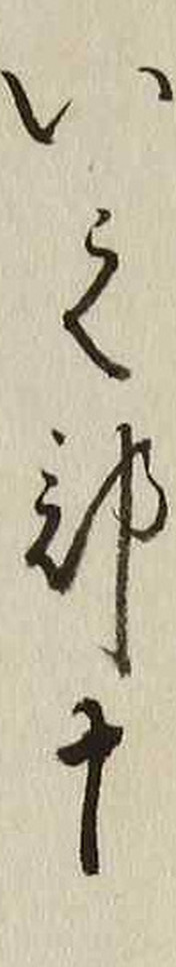い之部十
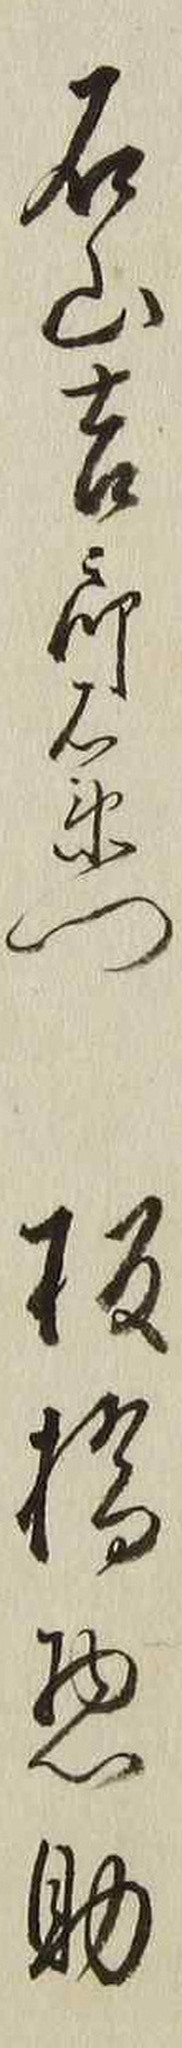石山吉郎右衛門板橋惣助
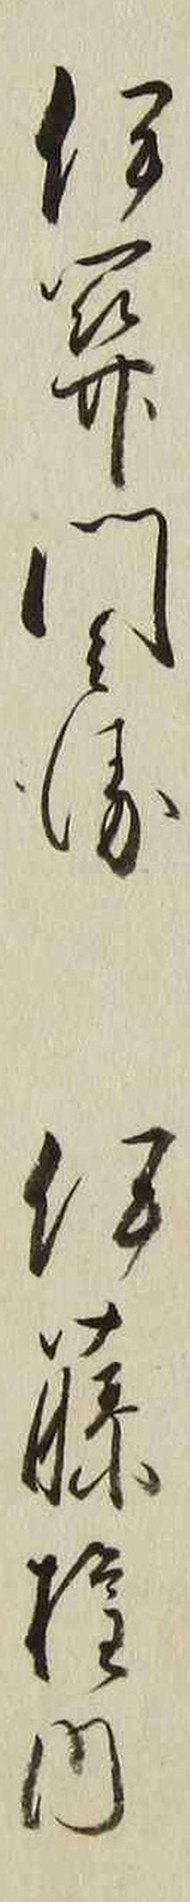伊関門兵衛伊藤権内

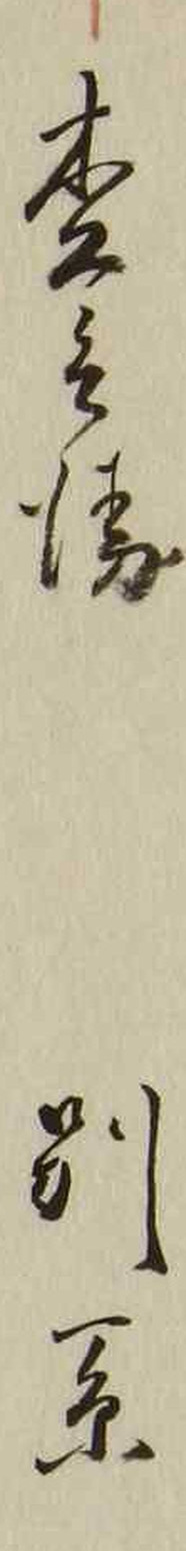杢兵衛別系
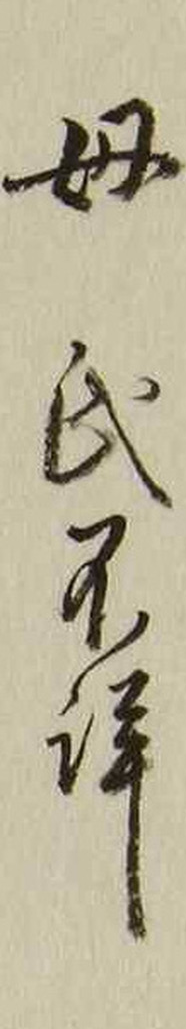母氏不詳
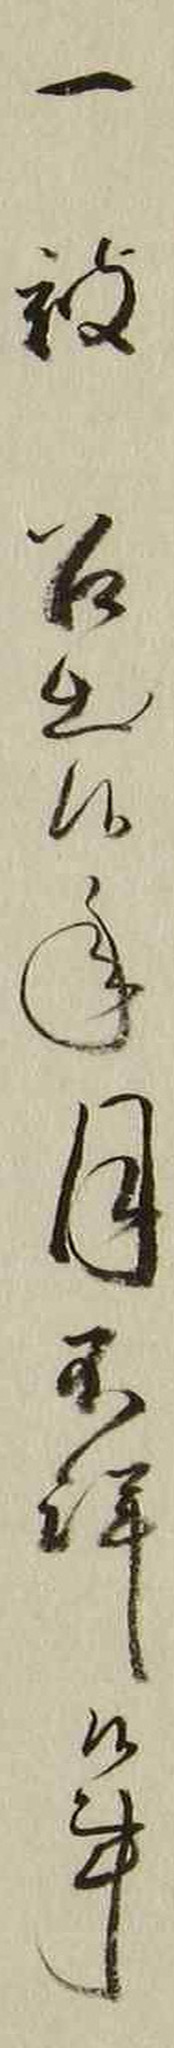一被召出候年月不詳候事
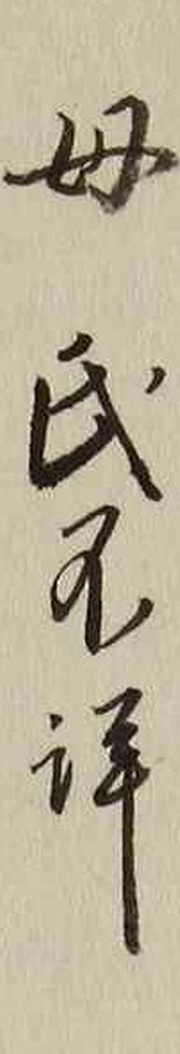母氏不詳
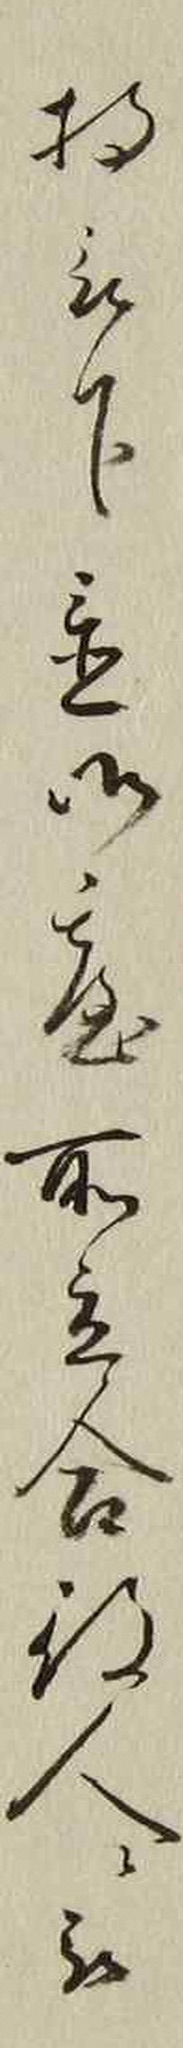持被下置御台所立会役人ニ被
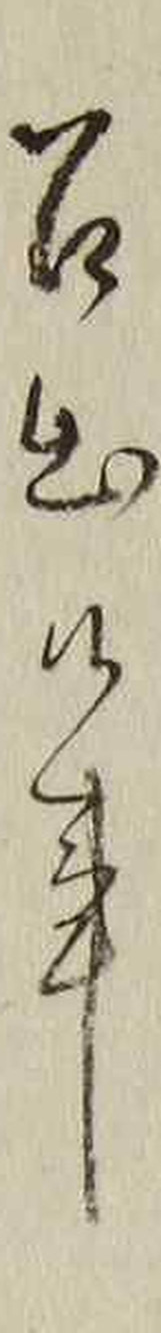召出候事
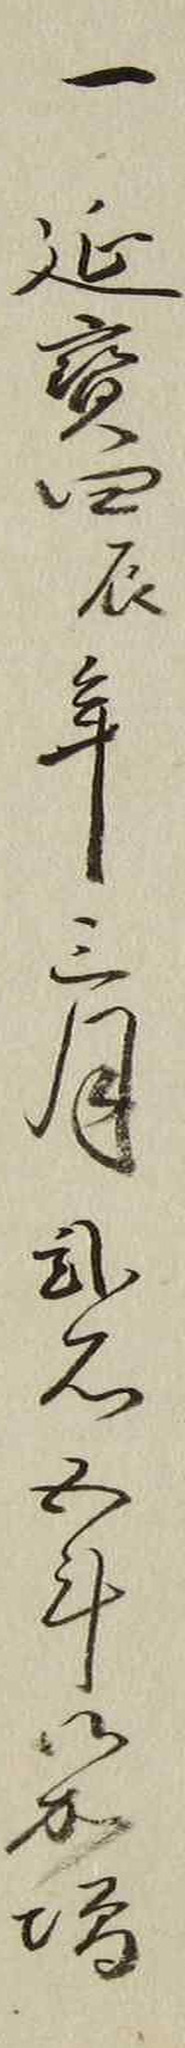一延宝四辰年三月弐石五斗御加増
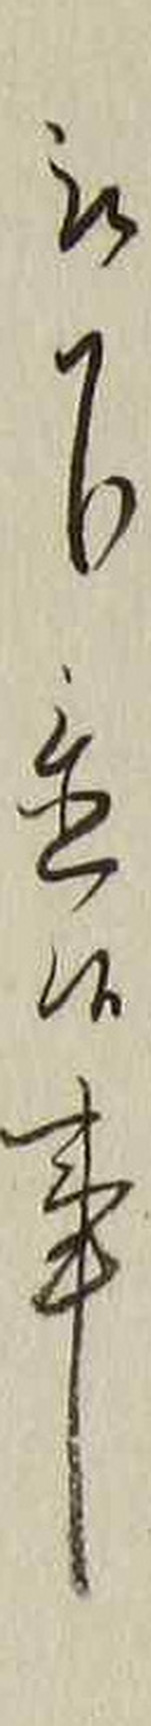被下置候事
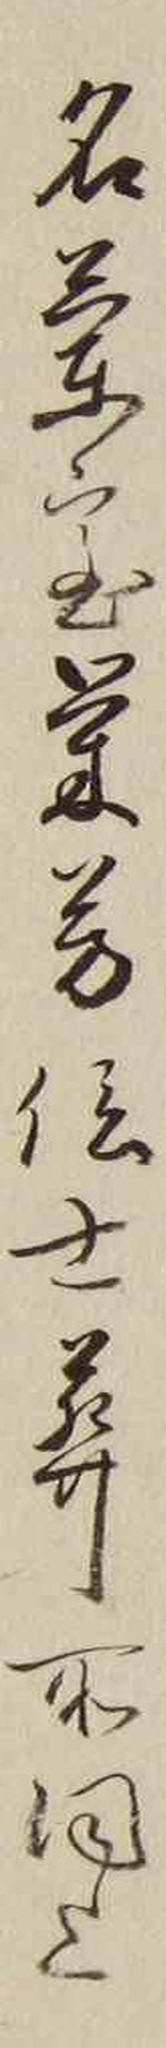名蘭宝栄芳信士葬所同上

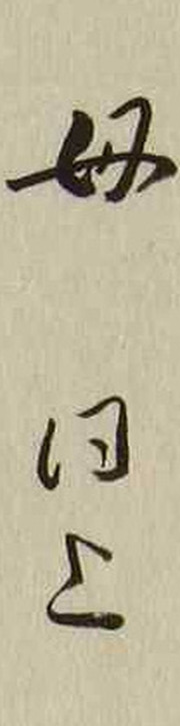母同上
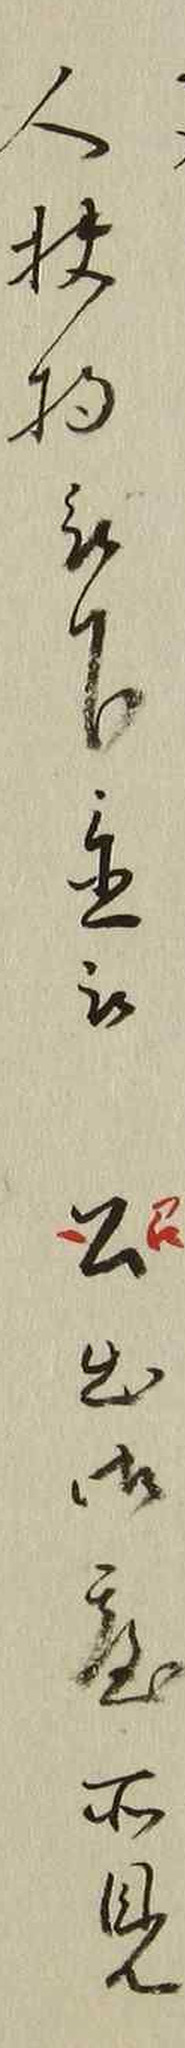人扶持被下置被召出御台所見
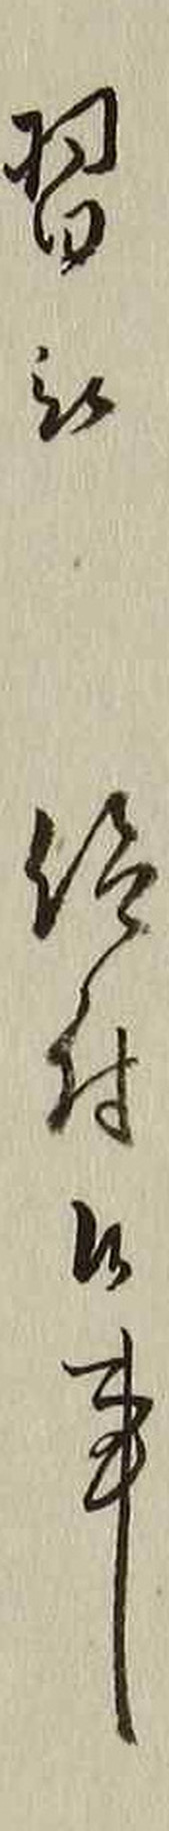習被仰付候事
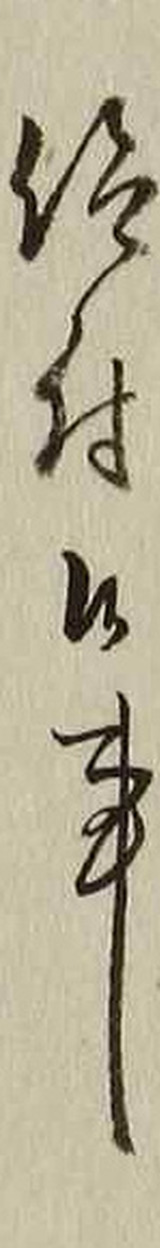仰付候事
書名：諸士系譜　巻之10　い之部10
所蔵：会津若松市立会津図書館
